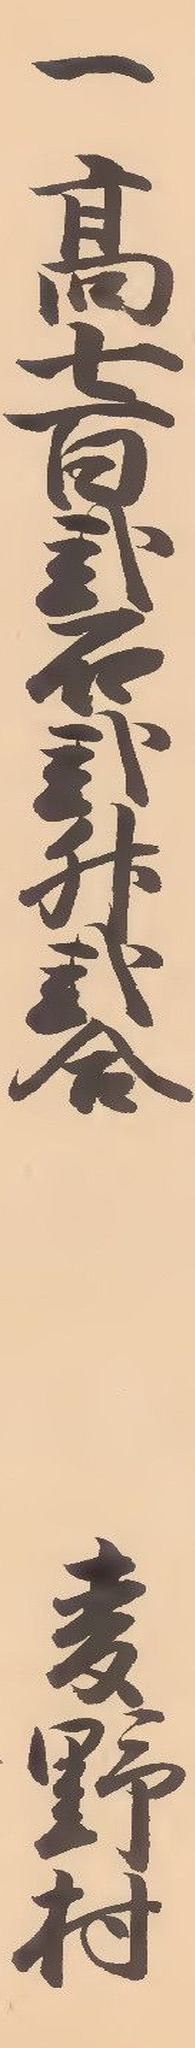一高七百弐石弐升弐合麦野村
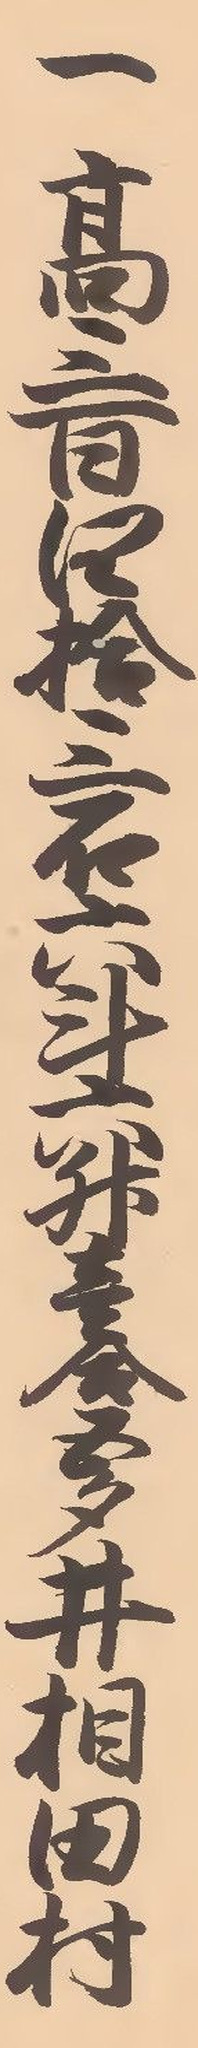一高三百四拾三石六斗六升壱合五勺井相田村
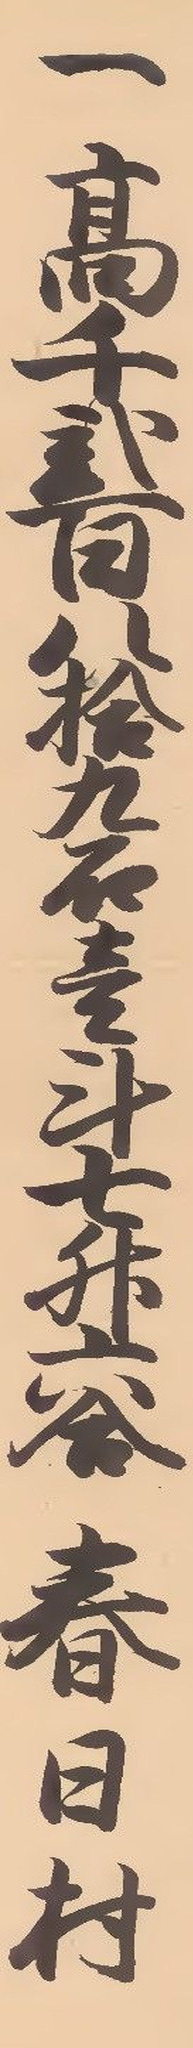一高千弐百八拾九石壱斗七升六合春日村
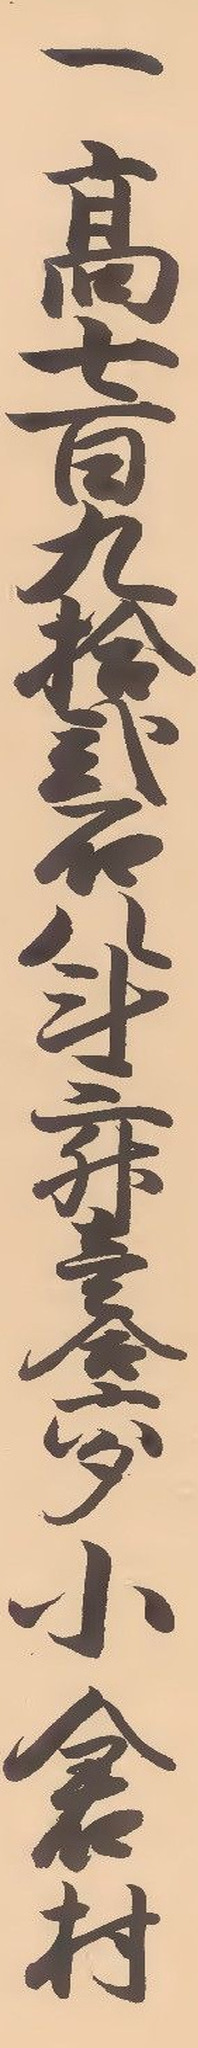一高七百九拾弐石八斗三升壱合六勺小倉村
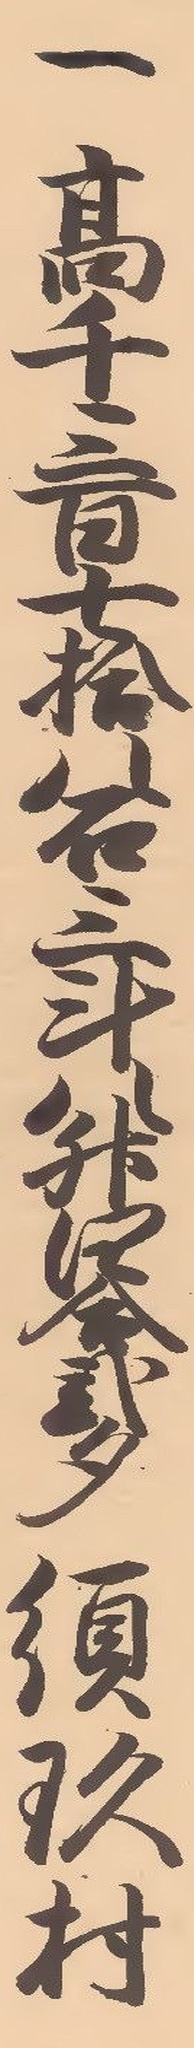一高千三百七拾八石三斗八升四合弐勺須玖村
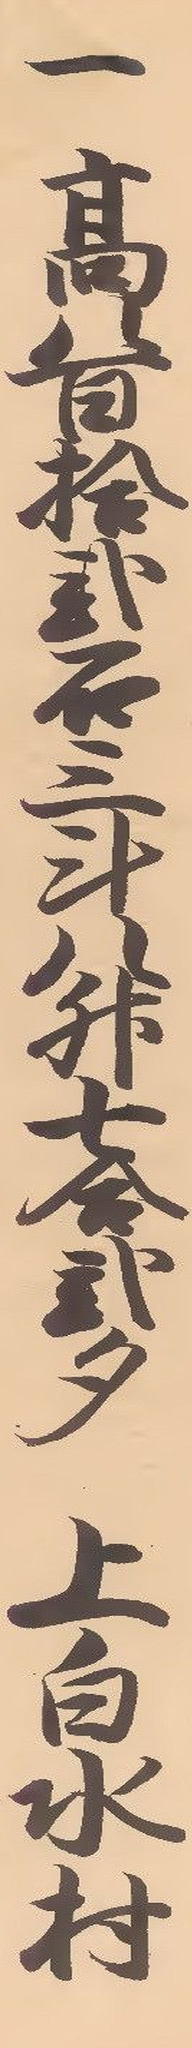一高八百拾弐石三斗八升七合弐勺上白水村

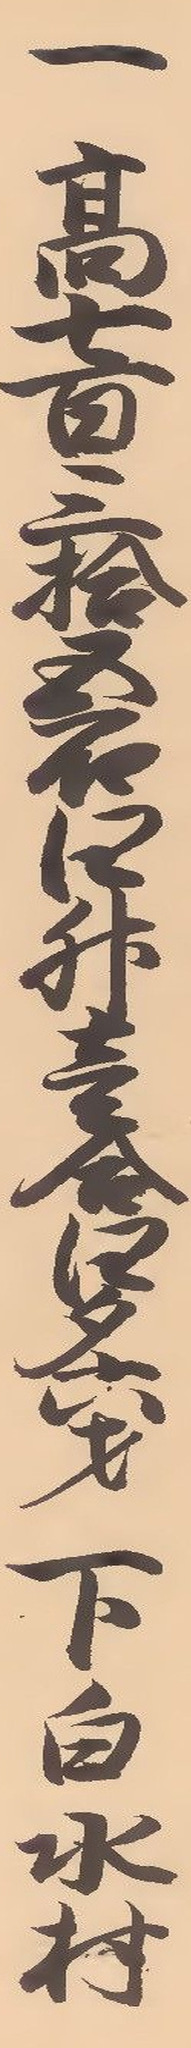一高七百三拾五石四升壱合四勺六才下白水村
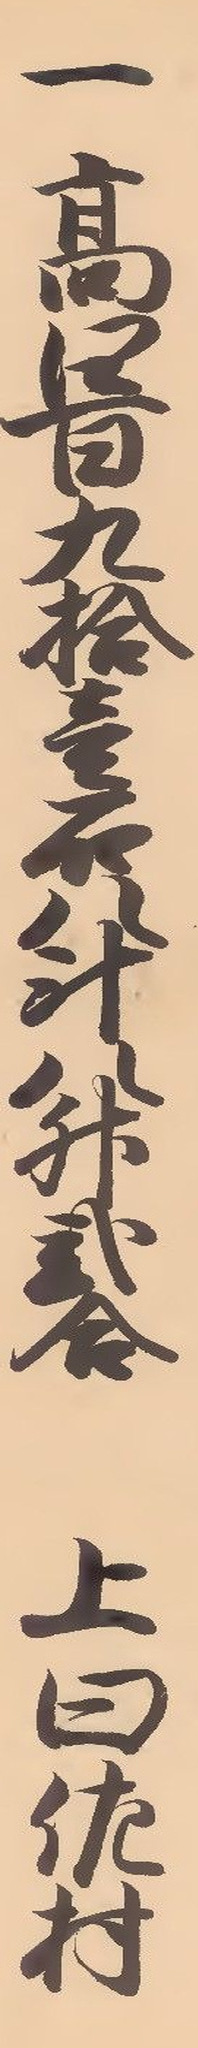一高四百九拾壱石八斗八升弐合上曰佐村
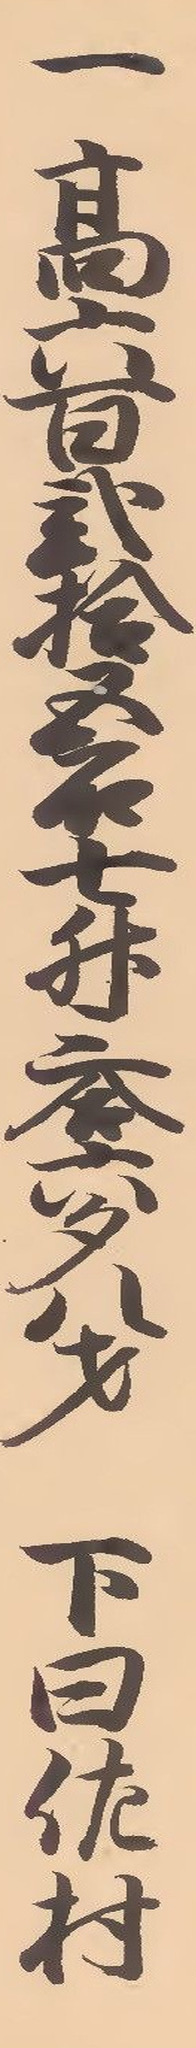一高六百弐拾五石七升三合六勺八才下曰佐村
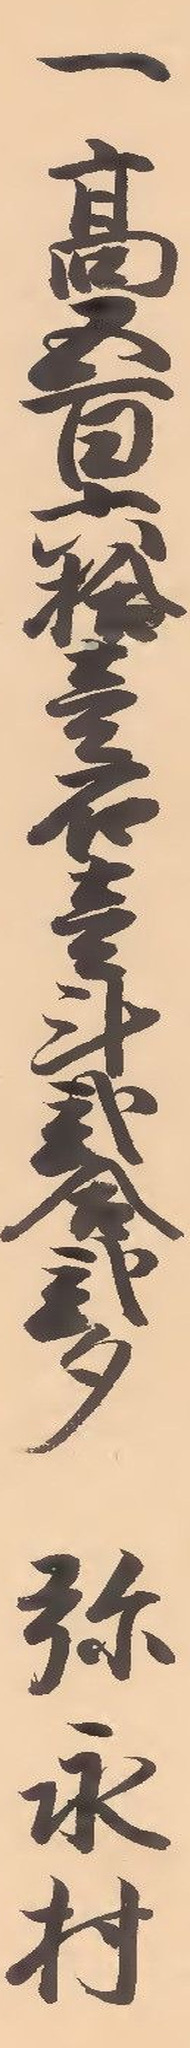一高五百六拾壱石壱斗弐合弐勺弥永村
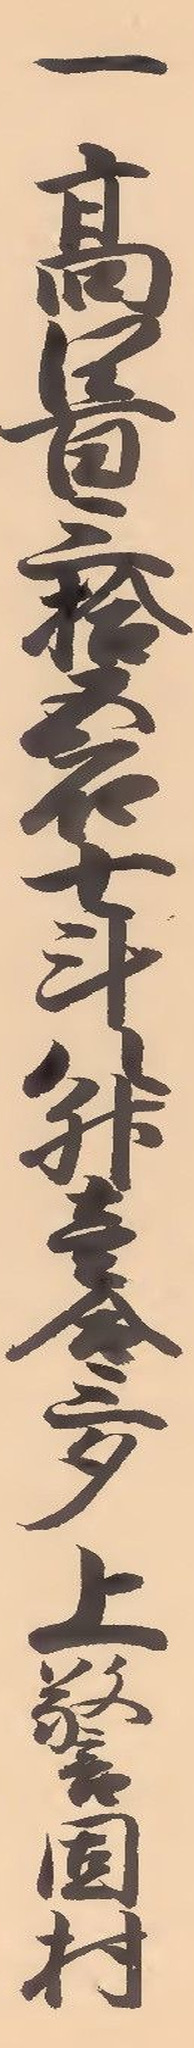一高四百三拾五石七斗八升壱合三勺上警固村
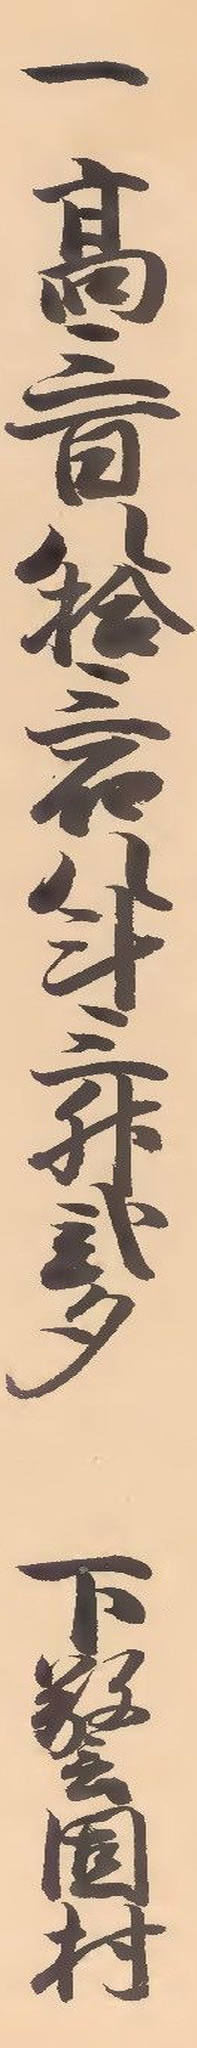一高三百八拾三石八斗三升弐勺下譬固村
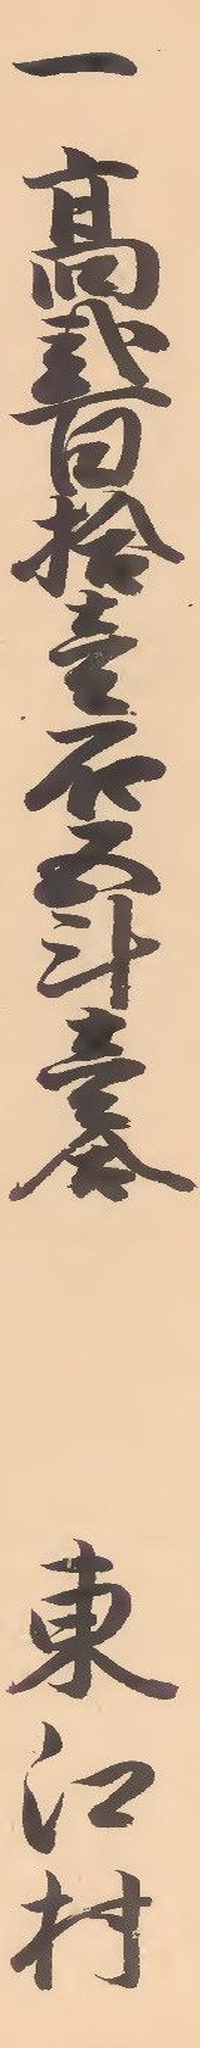一高弐百拾壱石五斗壱合東江村

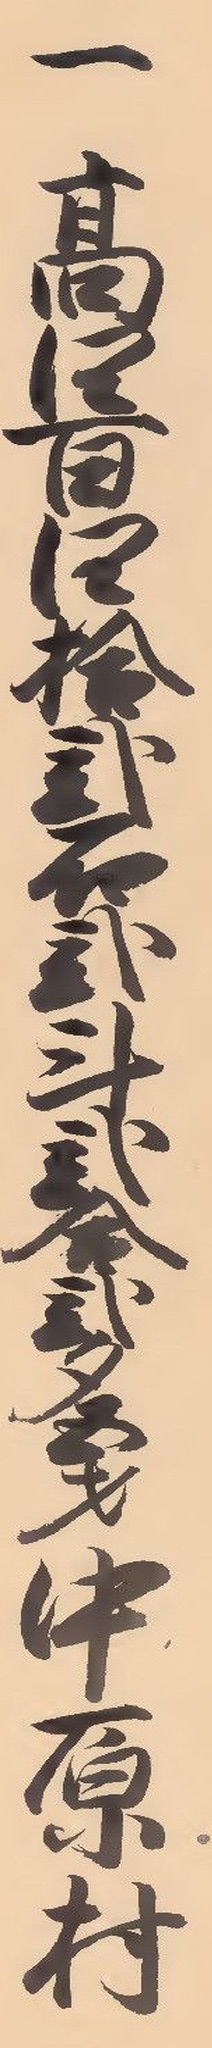一高四百四拾弐石弐斗弐合弐勺五才中原村
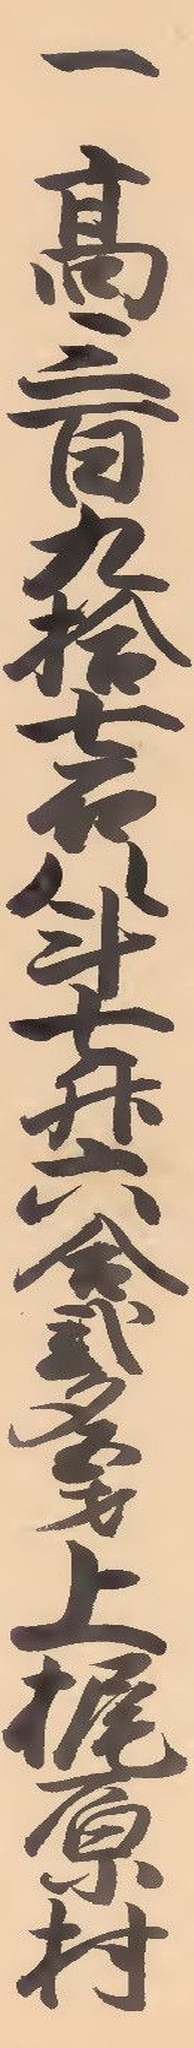一高三百九拾七石八斗七升六合弐勺五才上梶原村
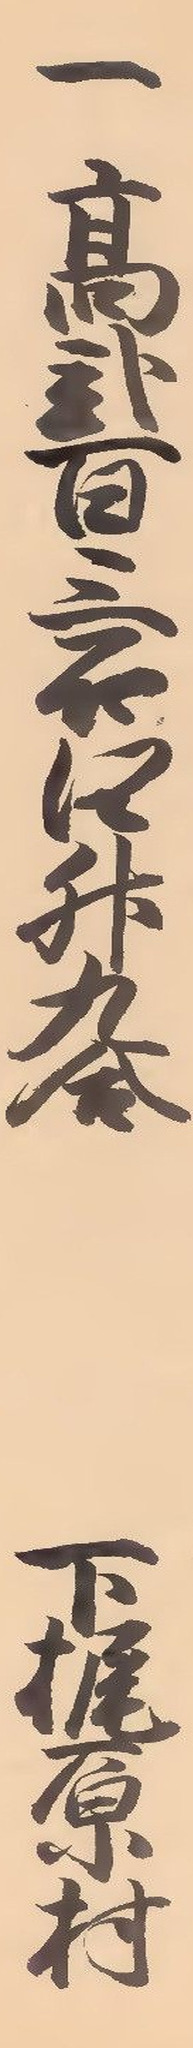一高弐百三石四升九合下梶原村
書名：筑前国郷帳
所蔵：国立公文書館 National Archives of Japan
